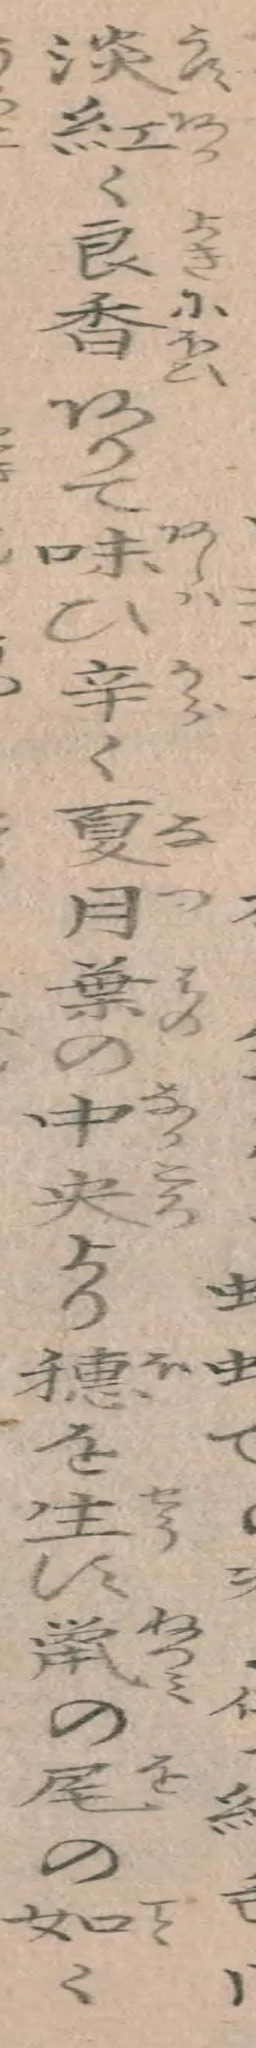淡紅く良香ありて味ひ辛く夏月葉の中央より穂を生す鼠の尾の如く
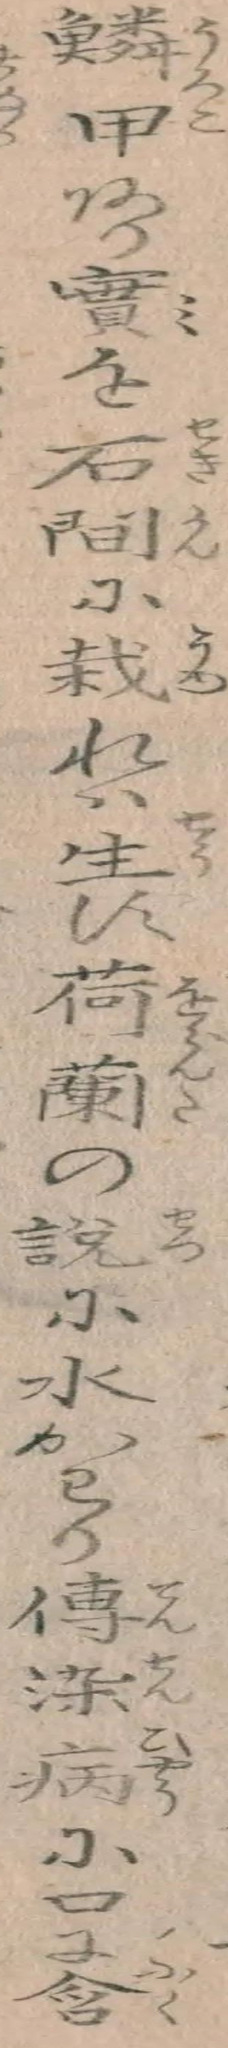鱗甲あり実を石間に栽れは生す荷蘭の説に水かわり伝染病に口に含
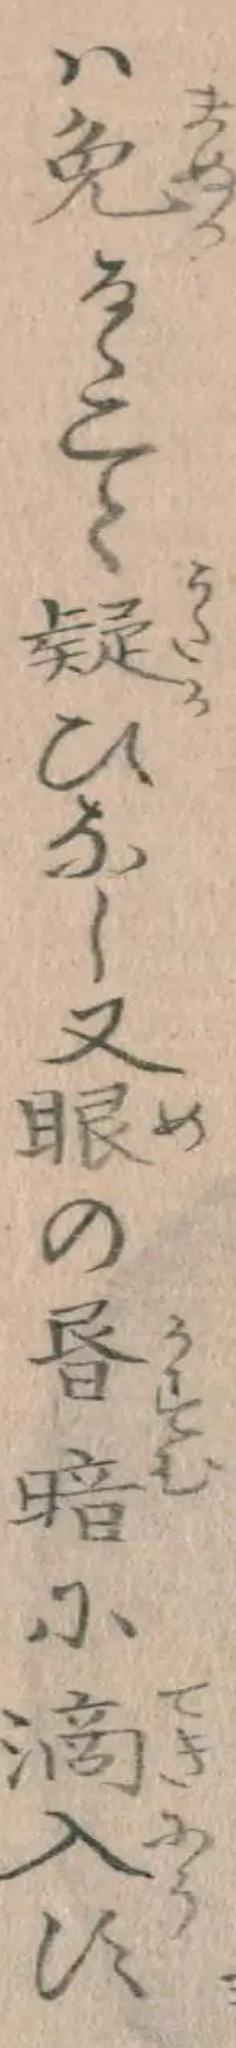は免るゝこと疑ひなし又眼の昏暗に滴入す

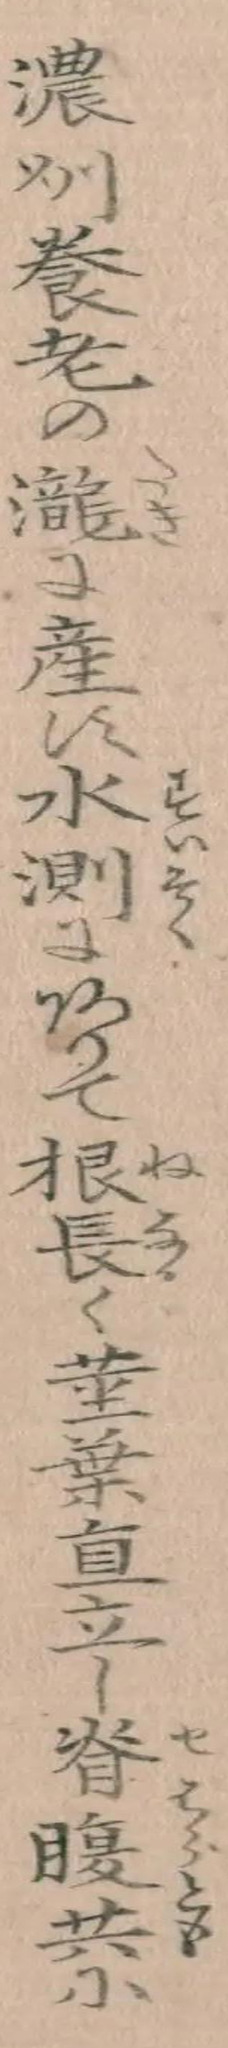濃州養老の滝に産す水測にありて根長く茎葉直立し脊腹共に
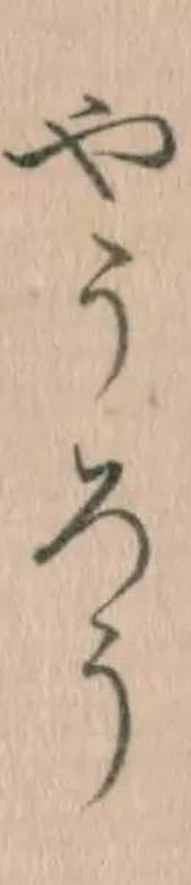やうろう
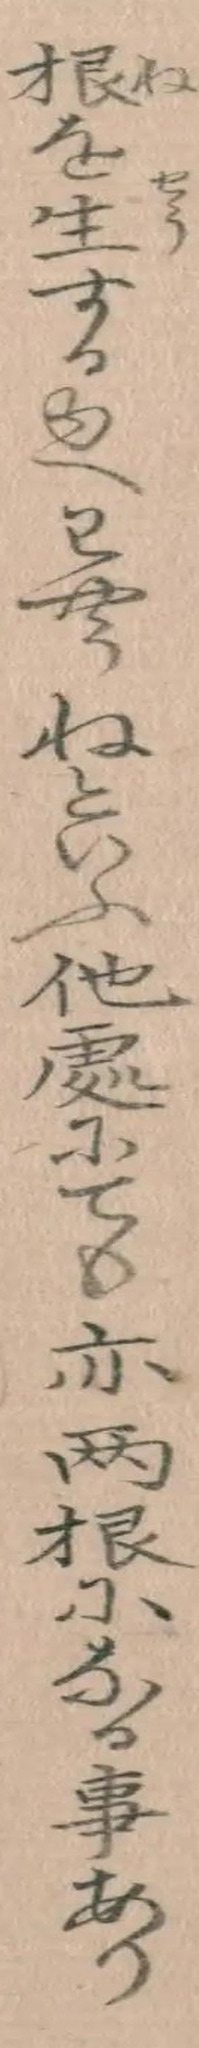根を生するゆへわやうねといふ他処にても亦両根になる事あり
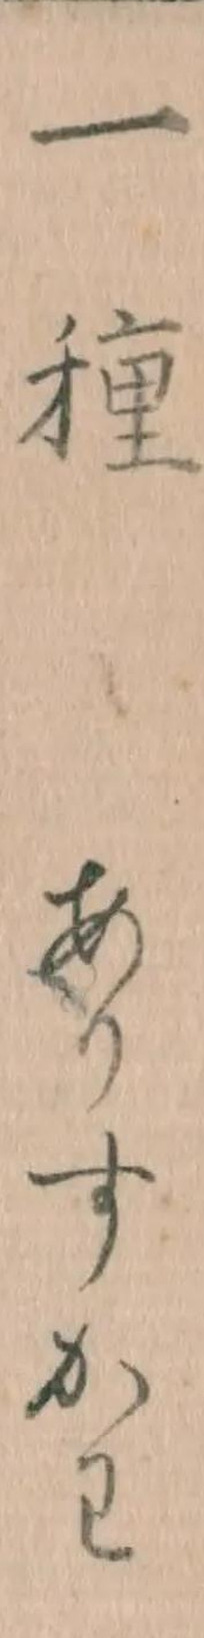一種ありすかわ
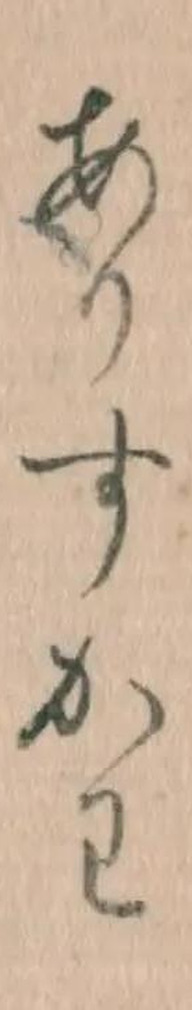ありすかわ
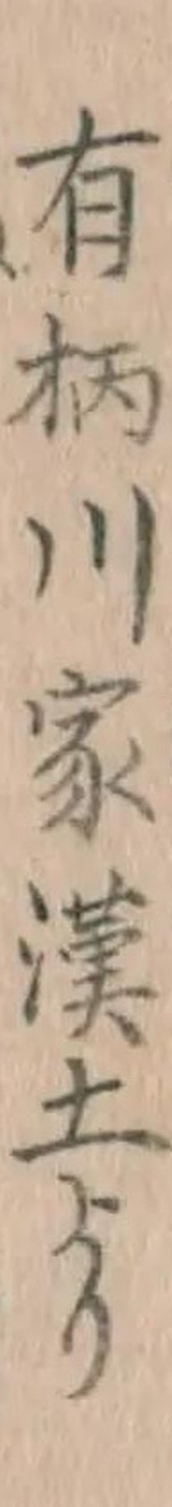有柄川家漢土より
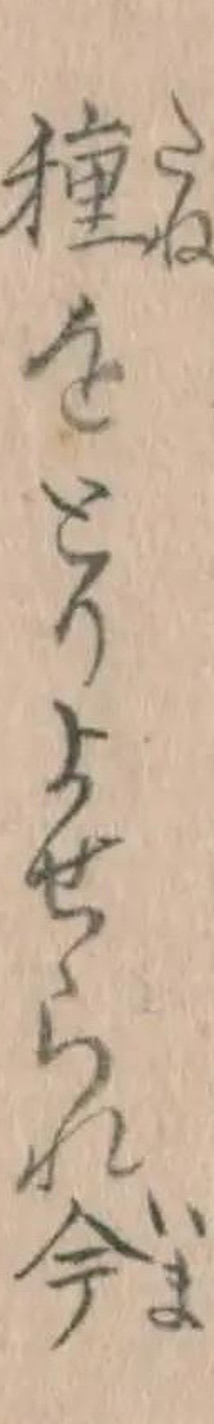種をとりよせられ今
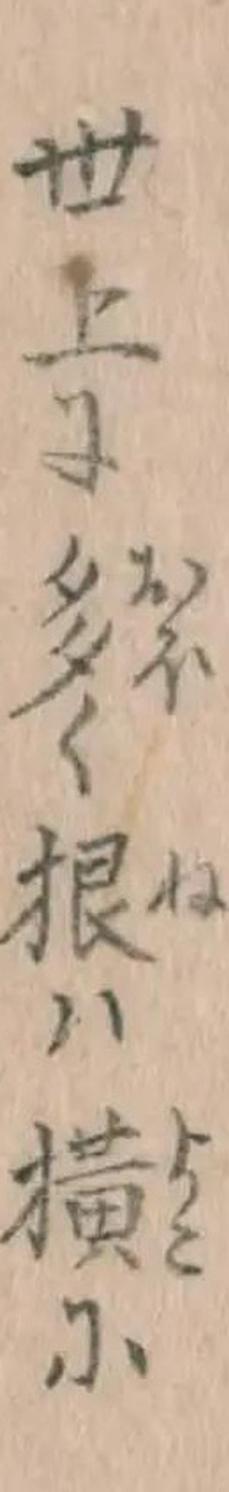世上に多く根は横に
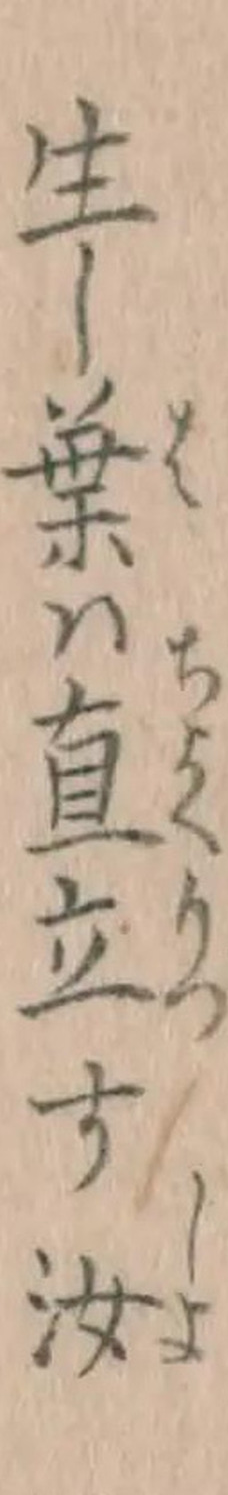生し葉は直立す汝
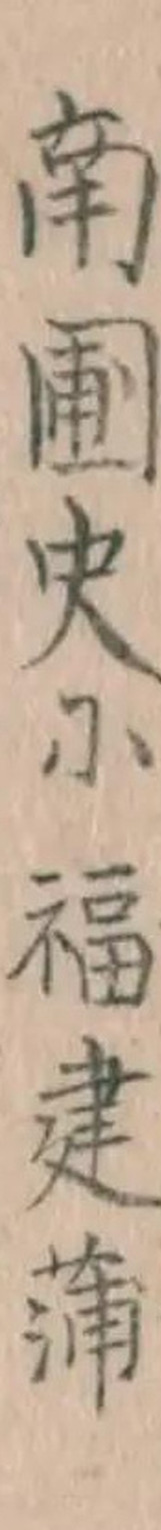南圃史に福建蒲
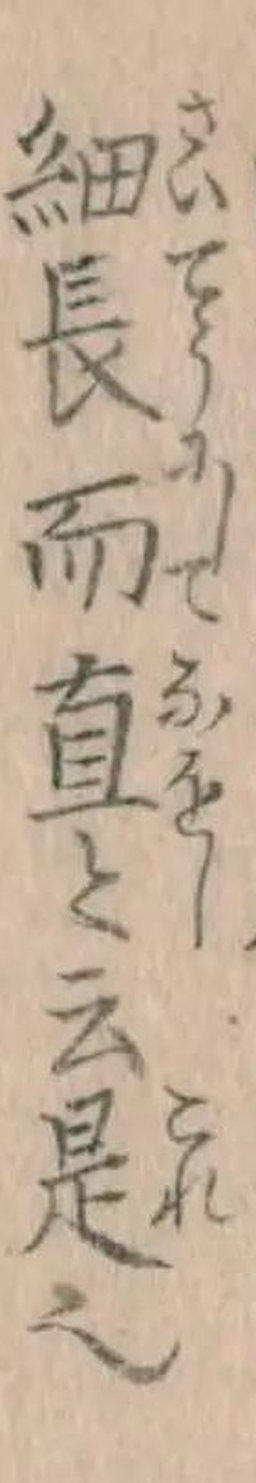細長而直と云是也

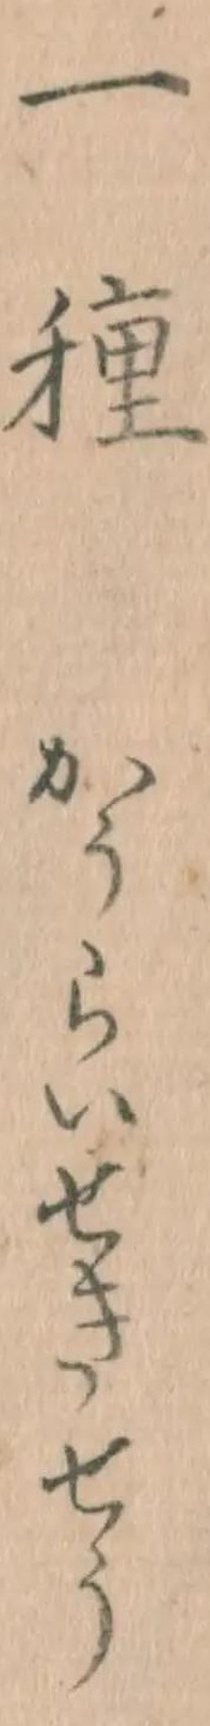一種かうらいせきせう
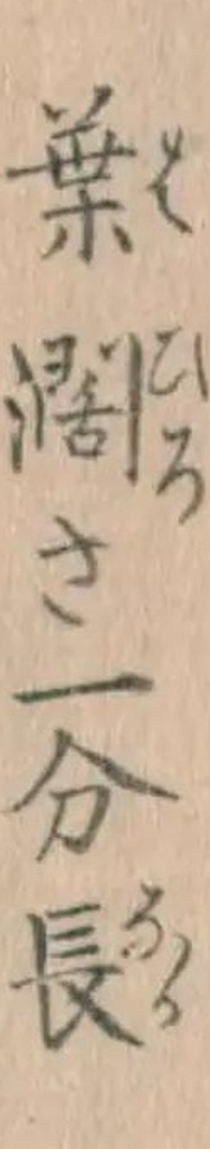葉闊さ一分長
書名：本草図譜. 巻31-33
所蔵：国立国会図書館 National Diet Library, JAPAN
